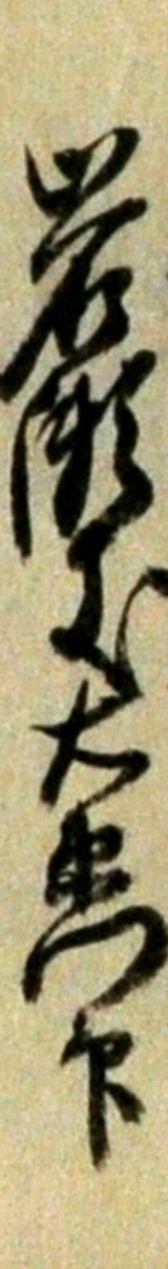岩瀬丈右衛門印
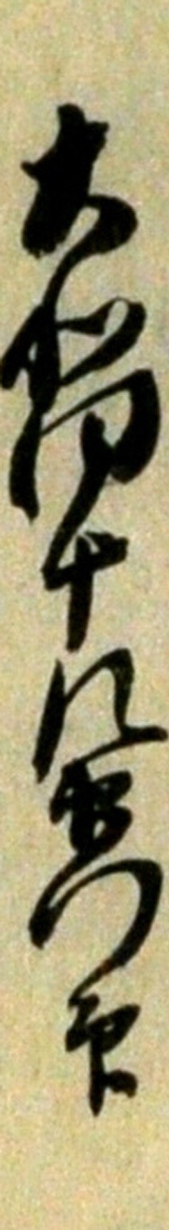大和田十左衛門印
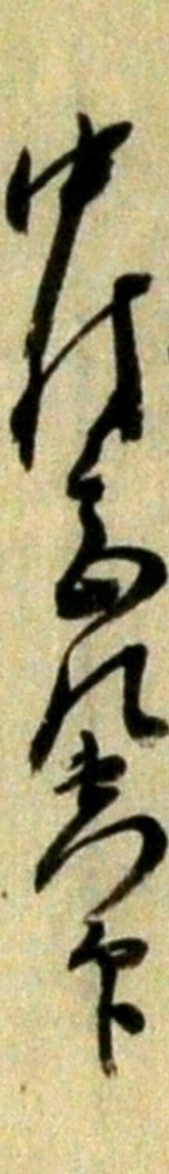中村甚左衛門印
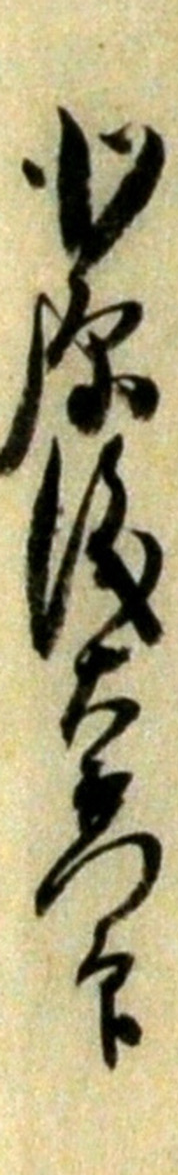北原儀右衛門印
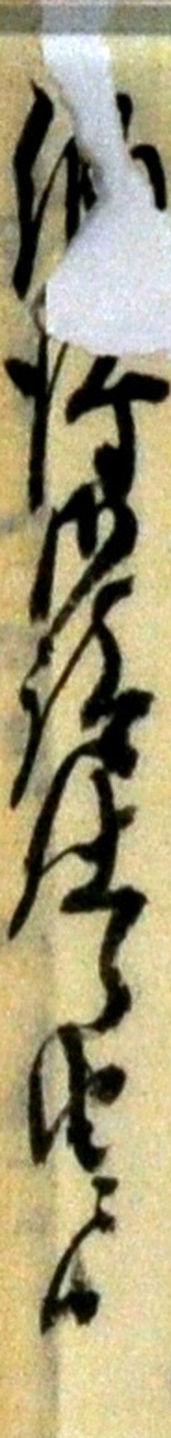納得御請仕候由ニ候
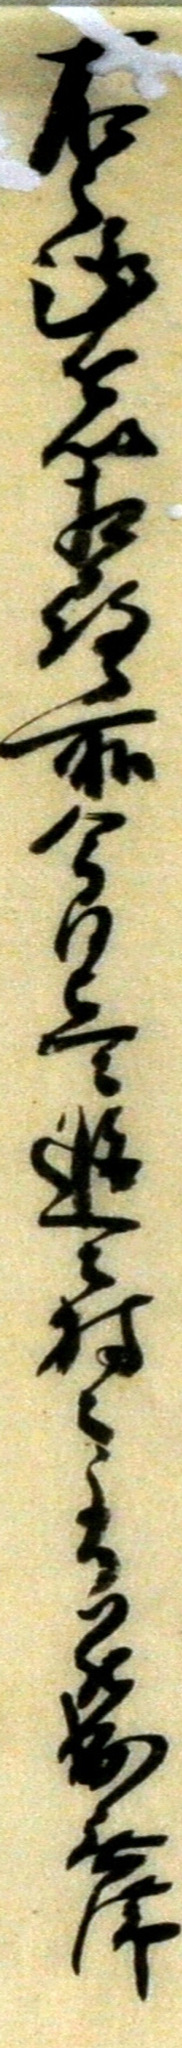右之趣今以相尋候処今日迄ニ追々より罷出無滞
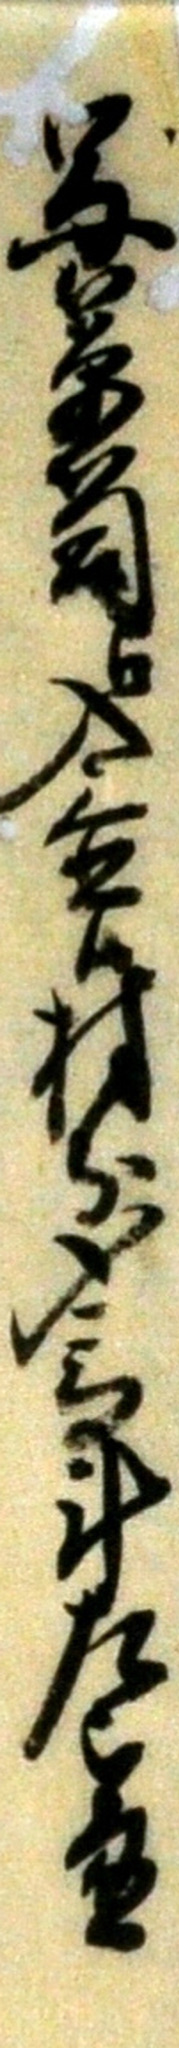写箪笥江入置候村分〆ニ而斗左之通
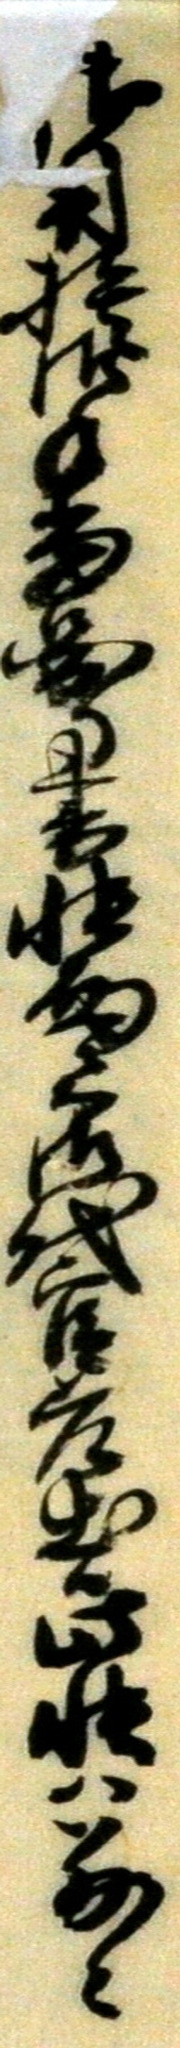御用捨御手当図り書帳面ニ而御代官ニ差出候此帳ハ前々
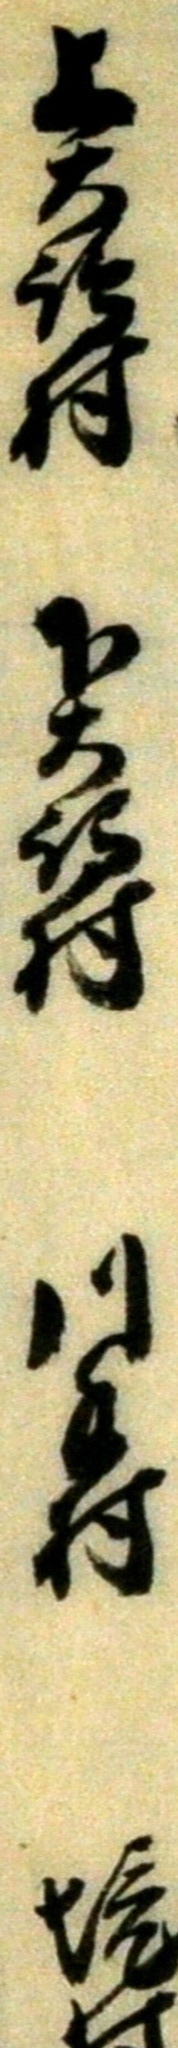上大嶋村下大嶋村川手村境村
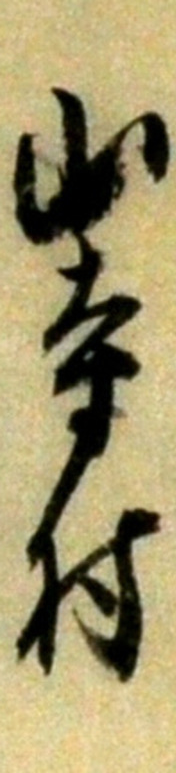山寺村
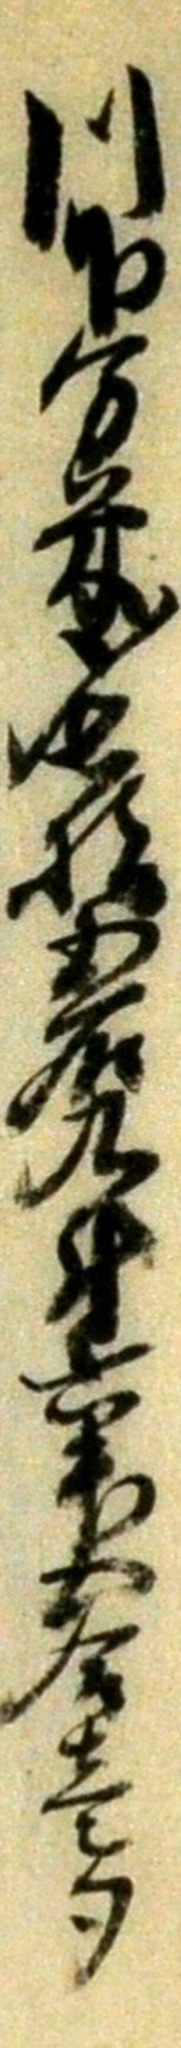川下分米〆七拾五石九斗六升五合壱勺
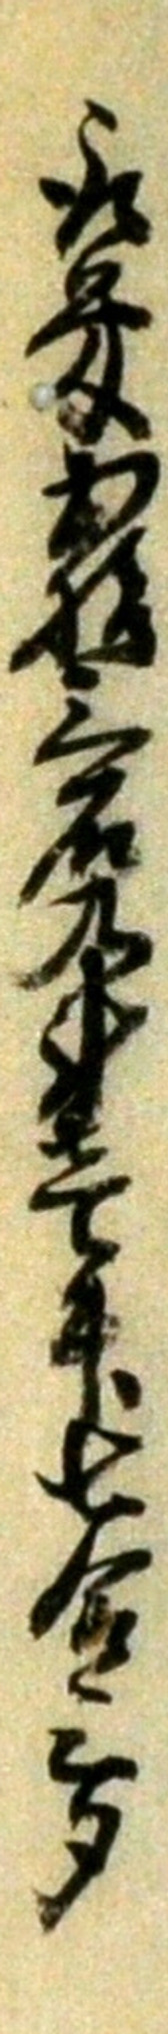取米五拾三石九斗壱升七合三勺
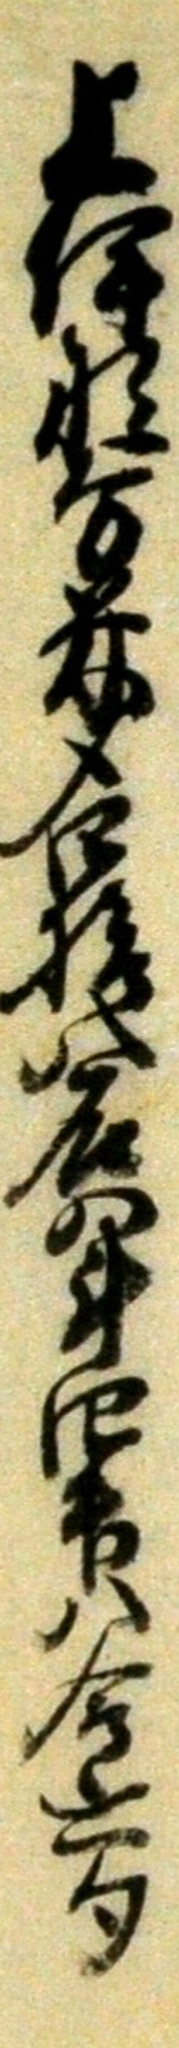上伊那分米〆四拾八石八斗四升八合六勺
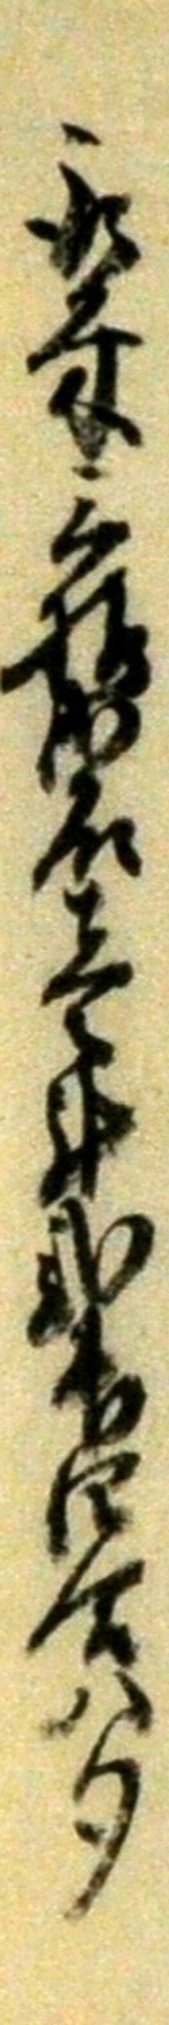取米三拾弐石壱斗弐升四合八勺
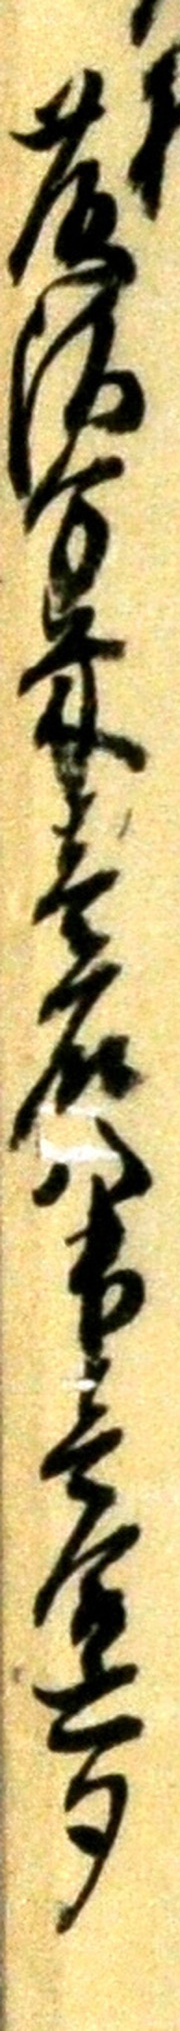藤沢分米壱石八升壱合六勺

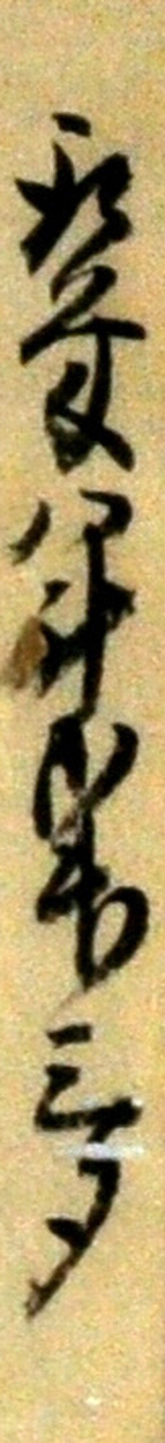取米八斗弐升三勺
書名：留書
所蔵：伊那市立高遠町図書館・合同会社AMANE
